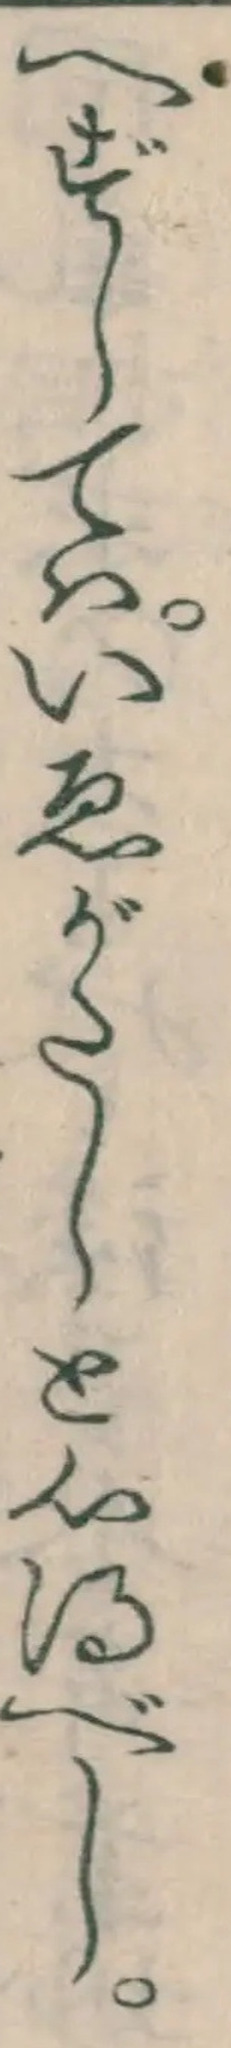へずしては。いゑがたしと心得べし。
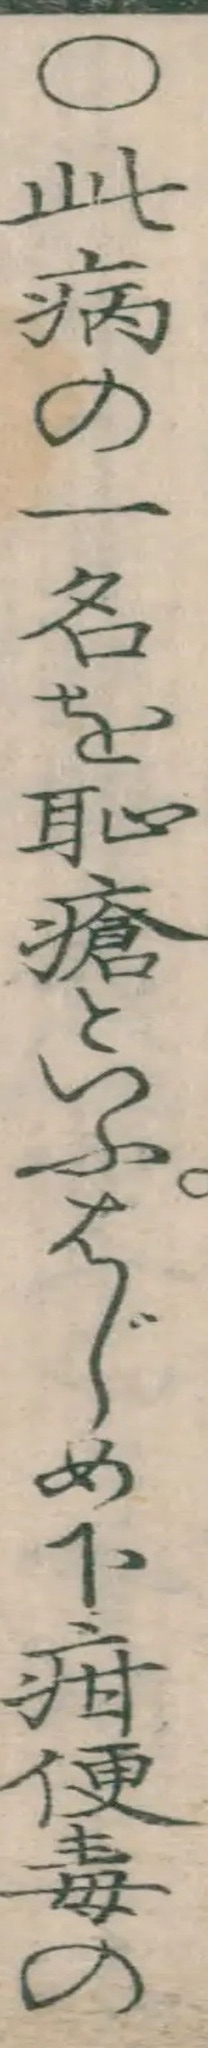〇此病の一名を恥瘡といふ。はじめ下疳便毒の

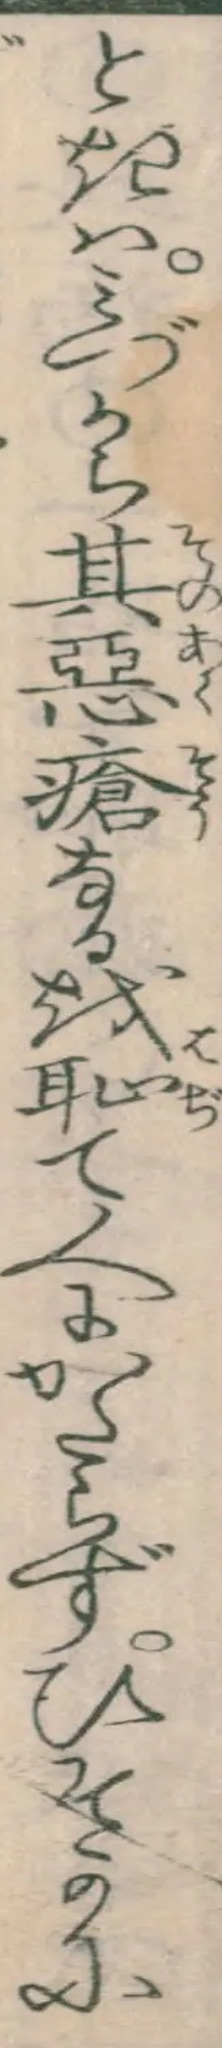ときは。みづから其悪瘡なるを恥て人にかたらず。ひそかに
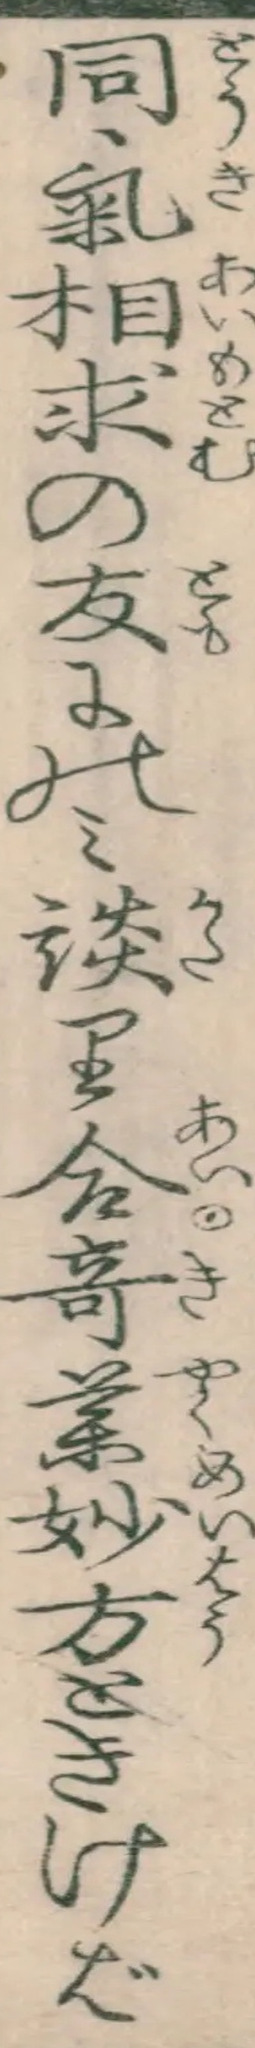同、氣相求の友にのみ談り合奇薬妙方ときけば
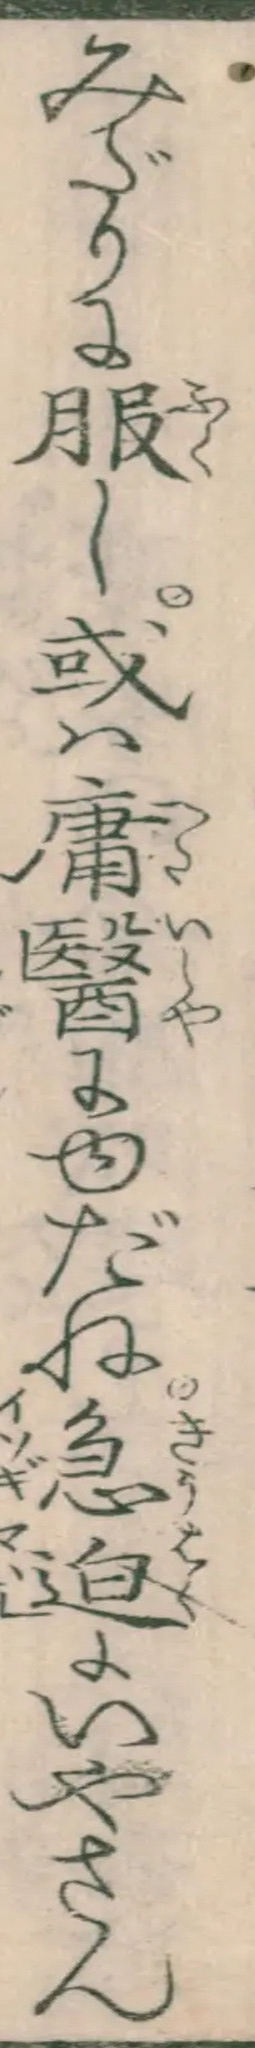みだりに服し。或は庸醫にゆだね。急迫にいやさん
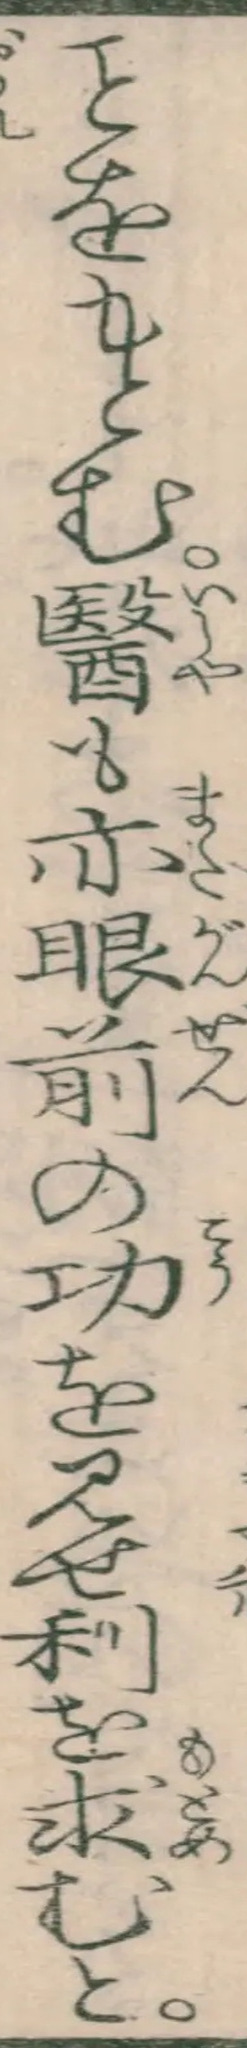ことをもとむ。醫も亦眼前の功を見せ利を求むと。
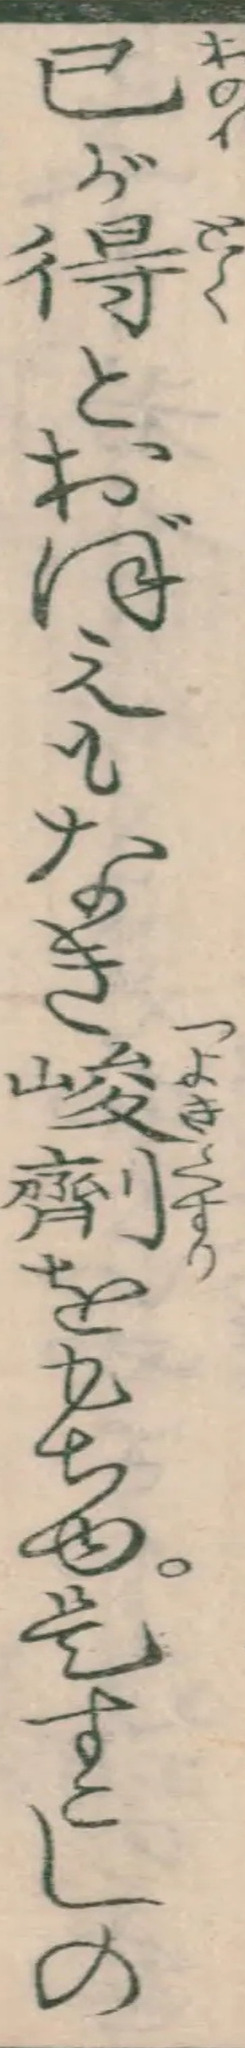己が得とおぼえもなき峻剤をもちゆ。是すこしの
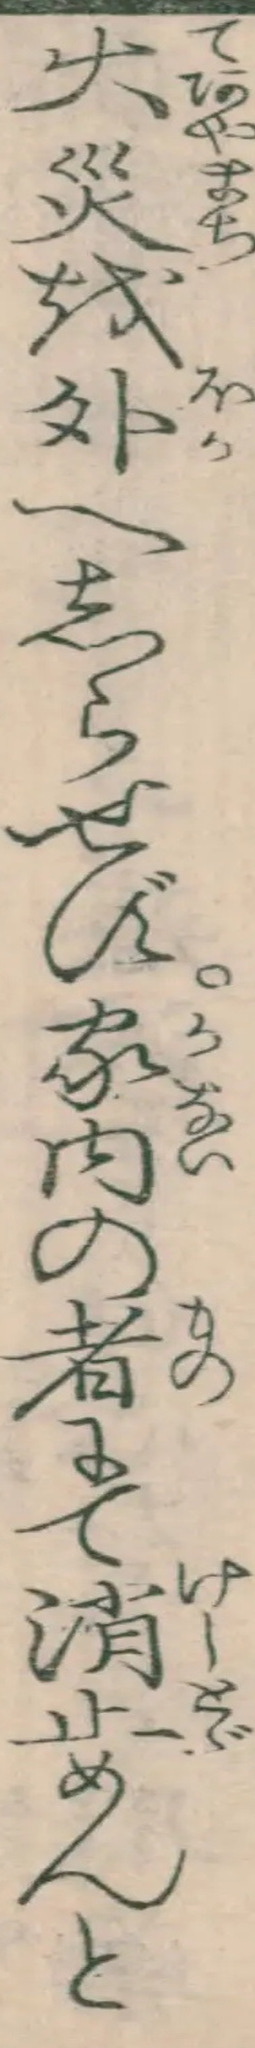火災を外へしらせず。家内の者にて消止めんと
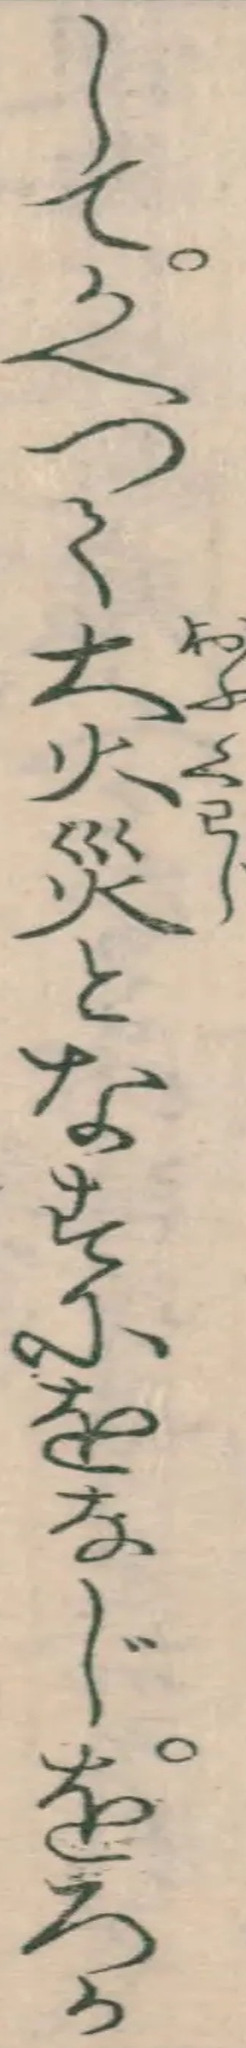して。かへつて大火災となすにをなじ。をろか
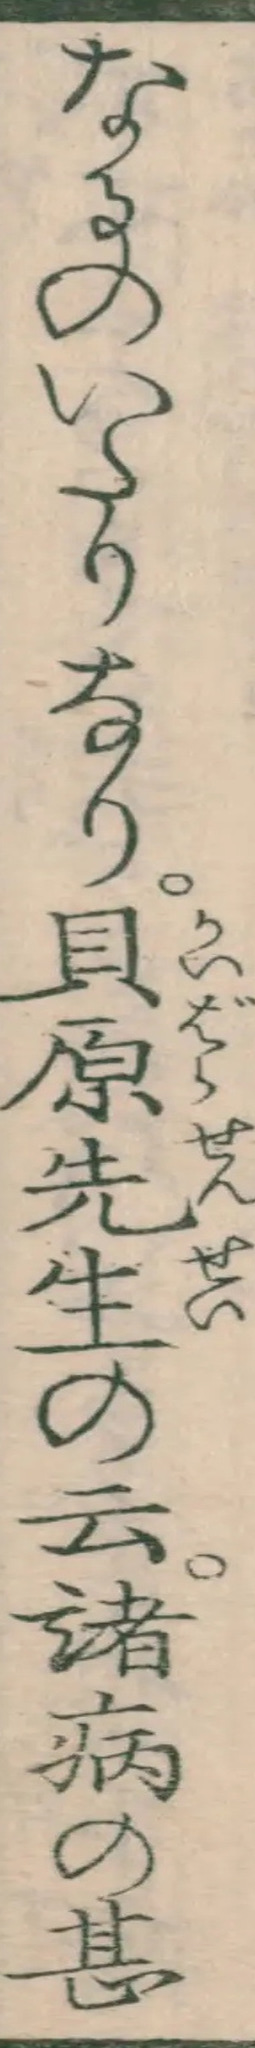なるのいたりなり。貝原先生の伝。諸病の甚
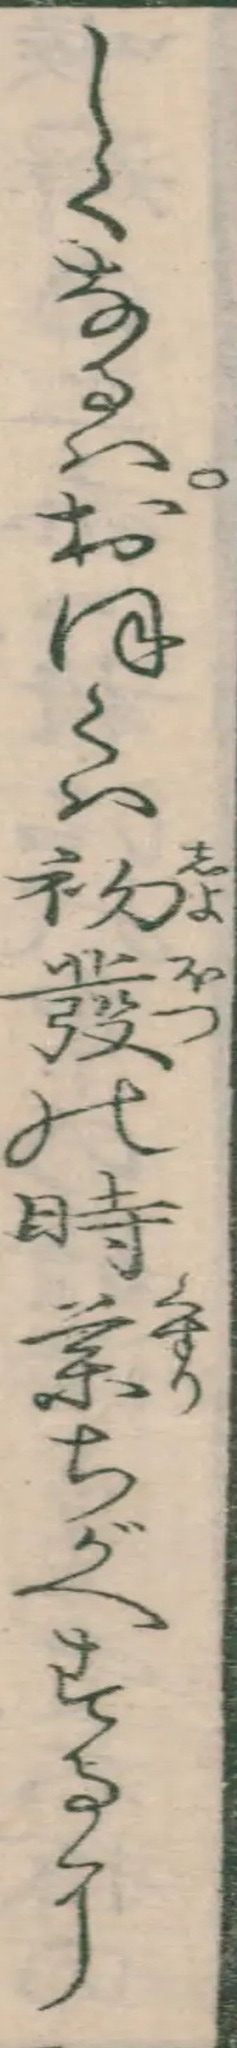しくなるは。おほくは初發の時薬ちがへするに
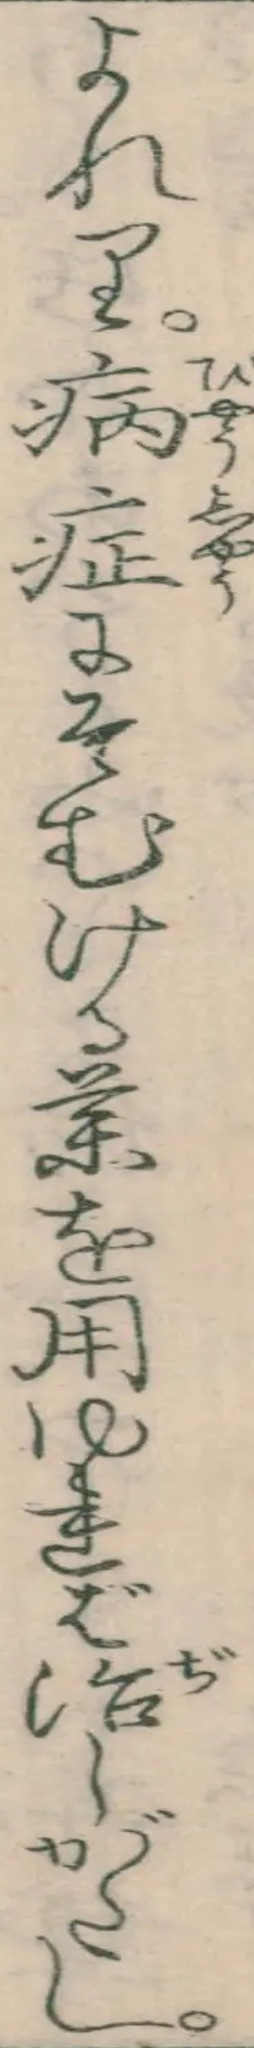よれり。病症にそむける薬を用ゆれば治しがたし。
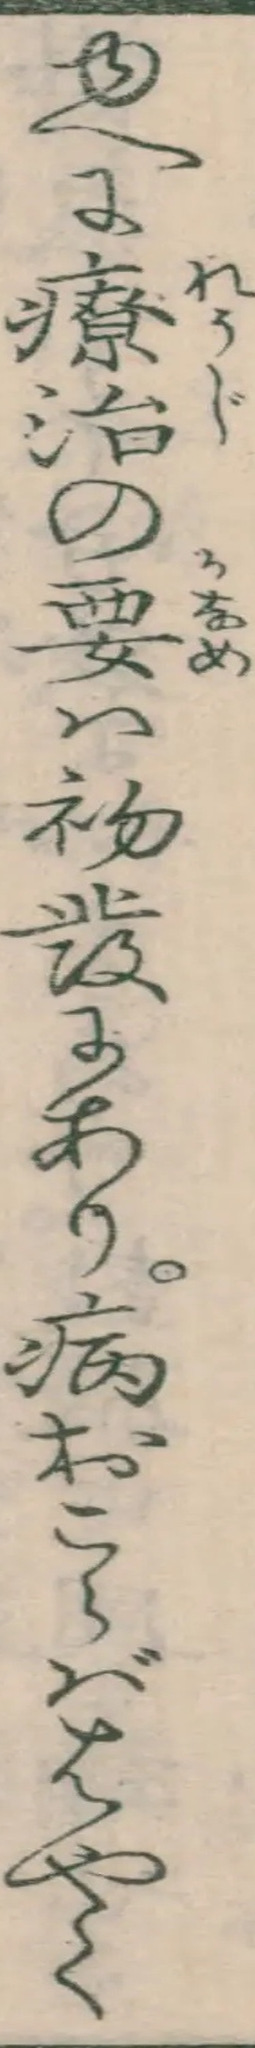ゆへに療治の要は初發にあり。病おこらばはやく
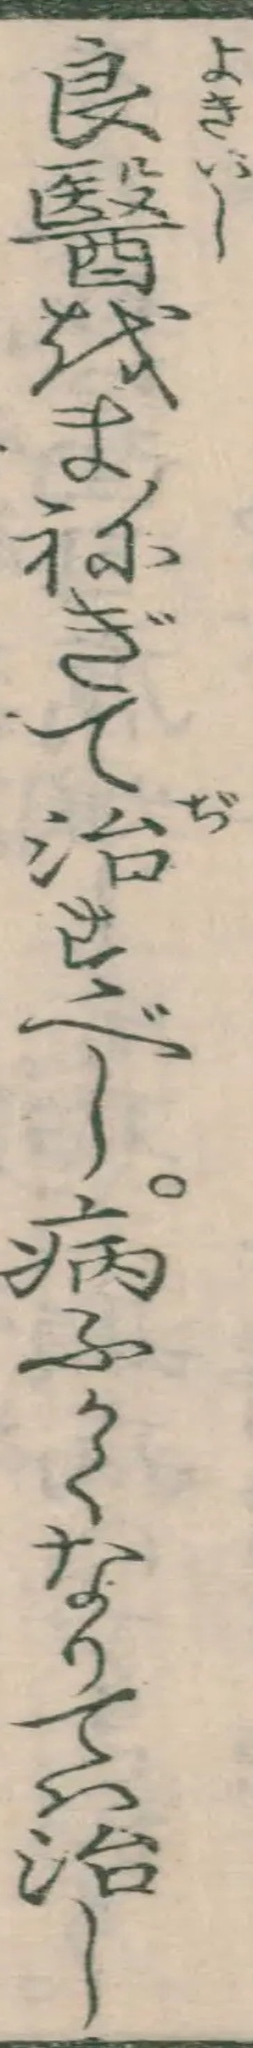良醫をめねぎて治すべし。病ふかくなりては治し
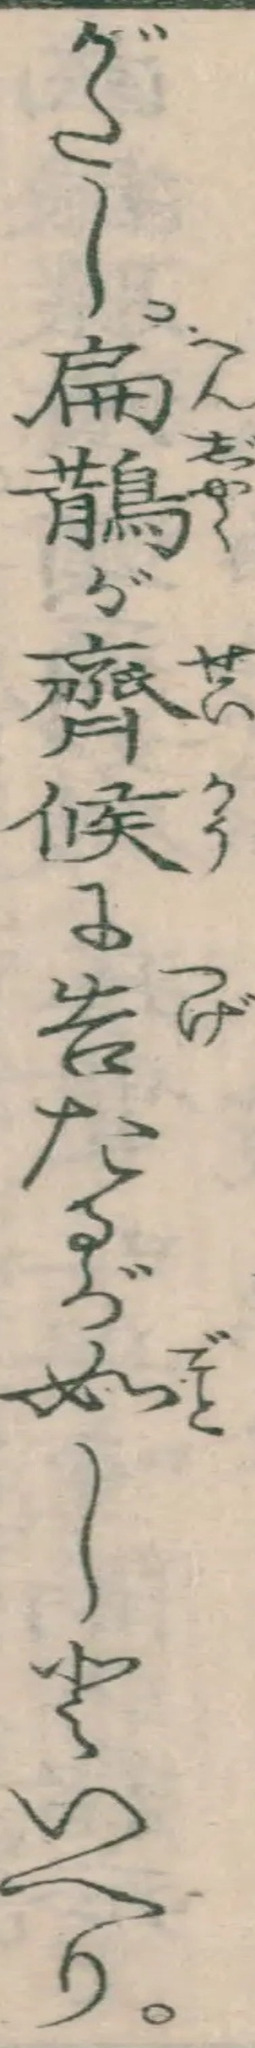がたし。扁鵲が齊候に告たるが如しといへり。
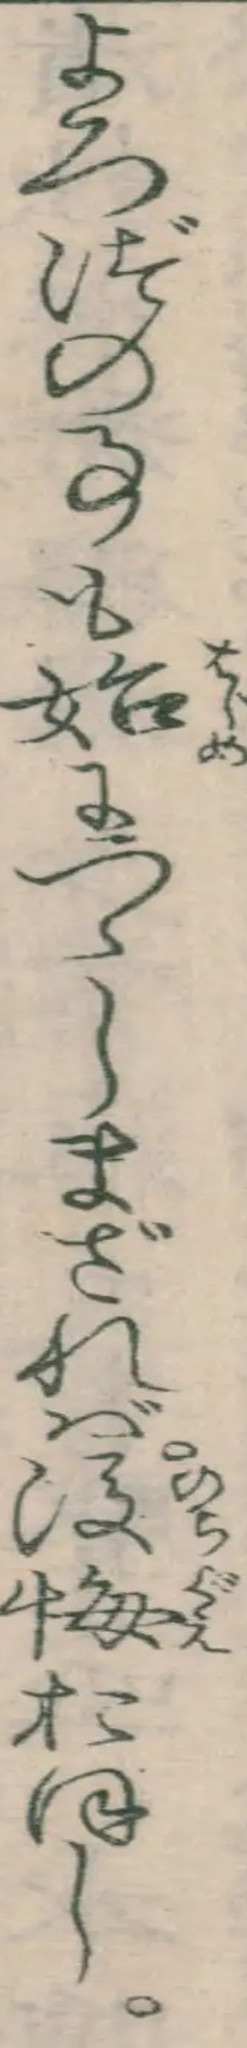よろずの事も始につゝしまざれば。後悔おほし。
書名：瘡家示訓
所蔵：国立国会図書館 National Diet Library, JAPAN
